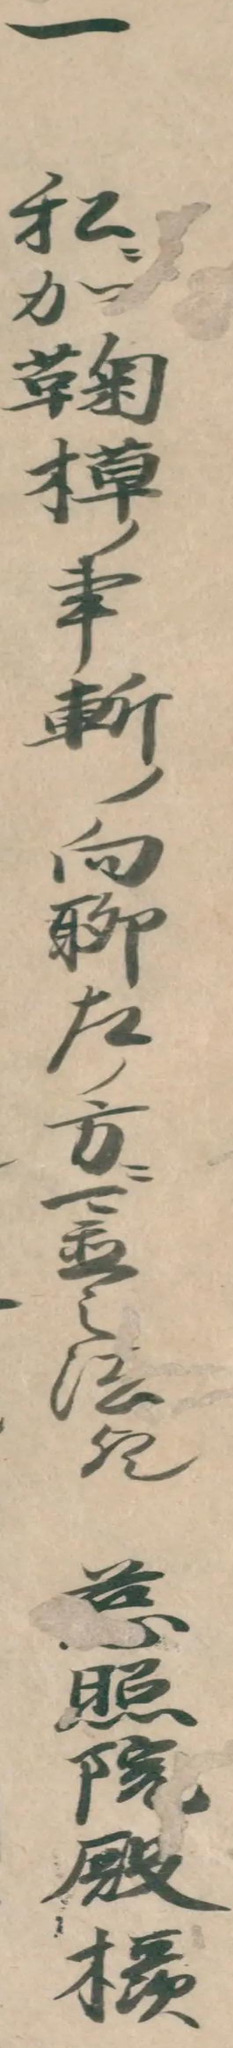一私に鞠棹の事軒の向聊左の方に並之法慈照院殿様
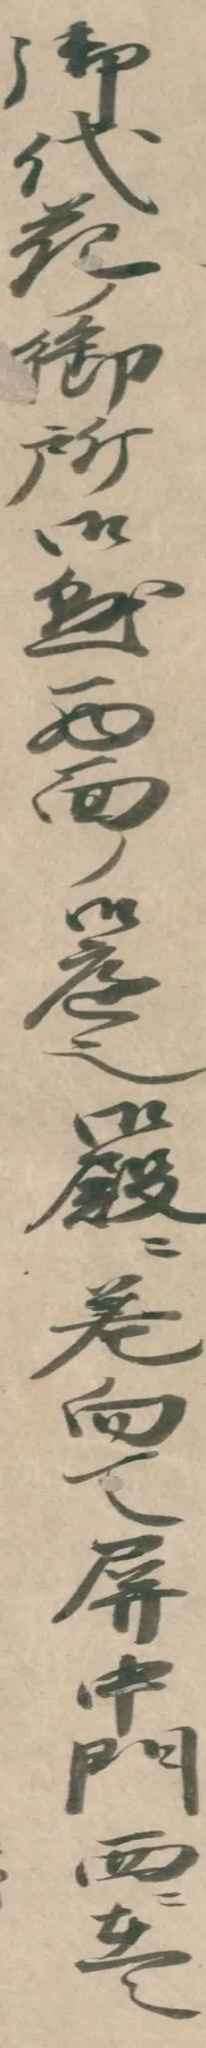御代花の御所御懸西面の御座也御殿に差し向て屏風中門に在て
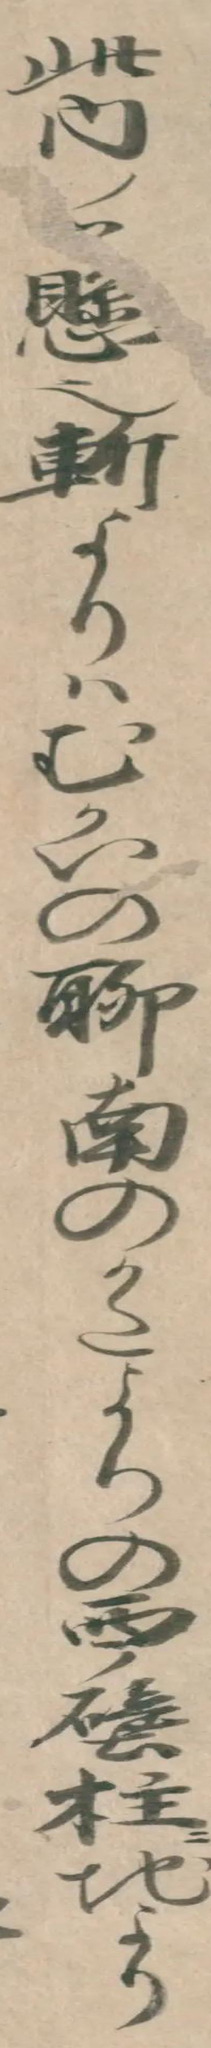此内の懸之軒よりはむかいの栁南のかたよりの西の壁柱に
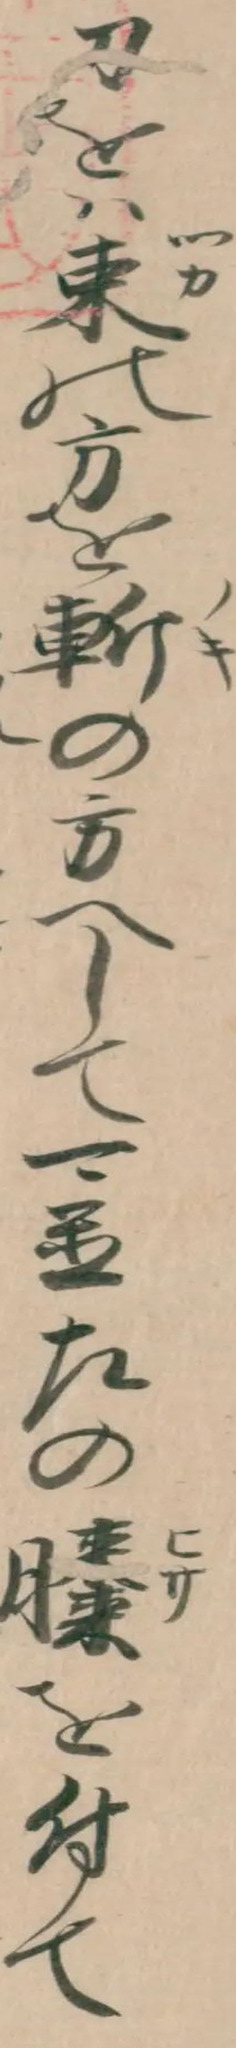刀をは束の方を軒の方へして一置左の膝を付て
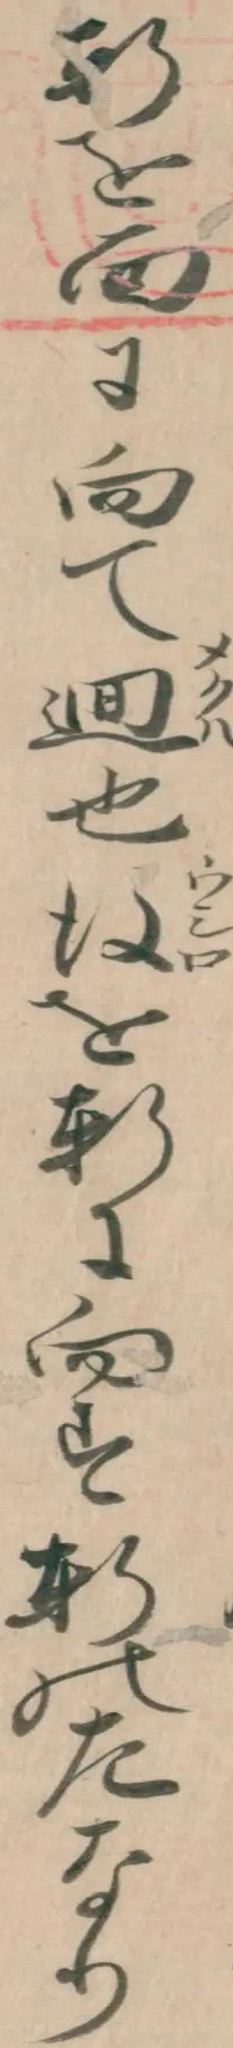形を面に向て廻也後ろを軒に向す軒の左なり
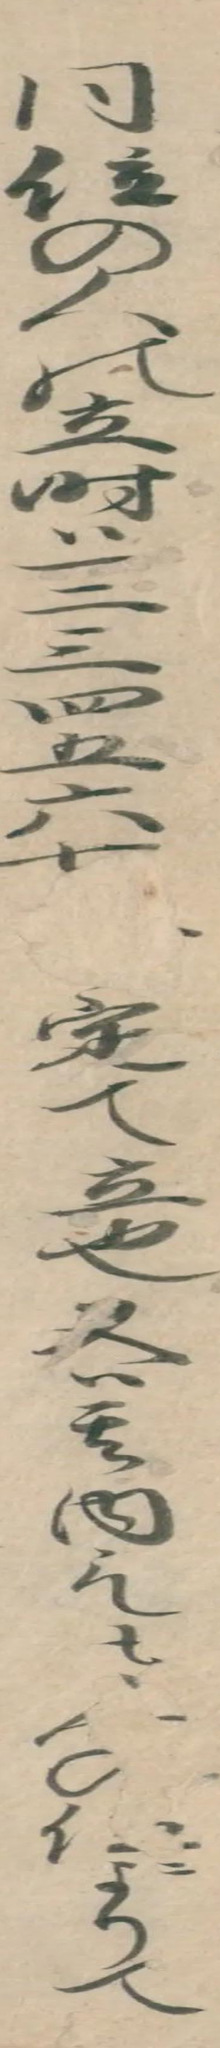一同位の人の立時は一二三四五六八定めて立也又は其内歟と人の

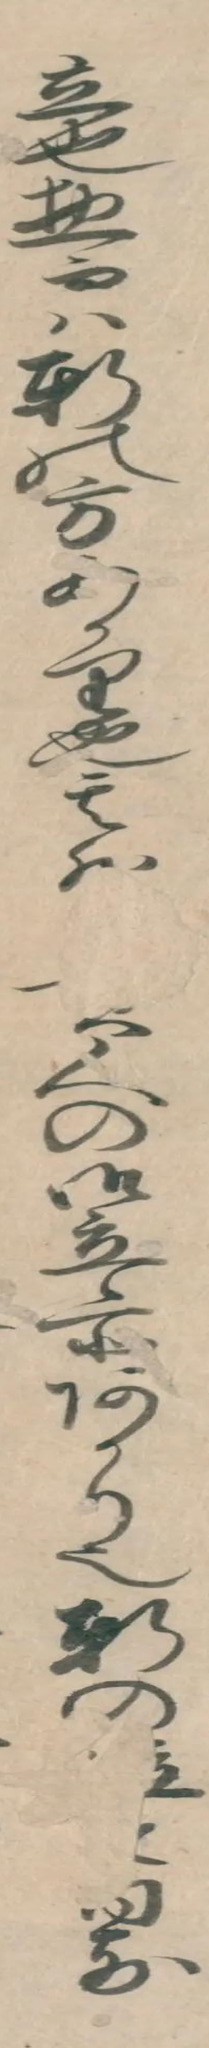立也は軒の方あかり也其人の御立所のあかり也軒の
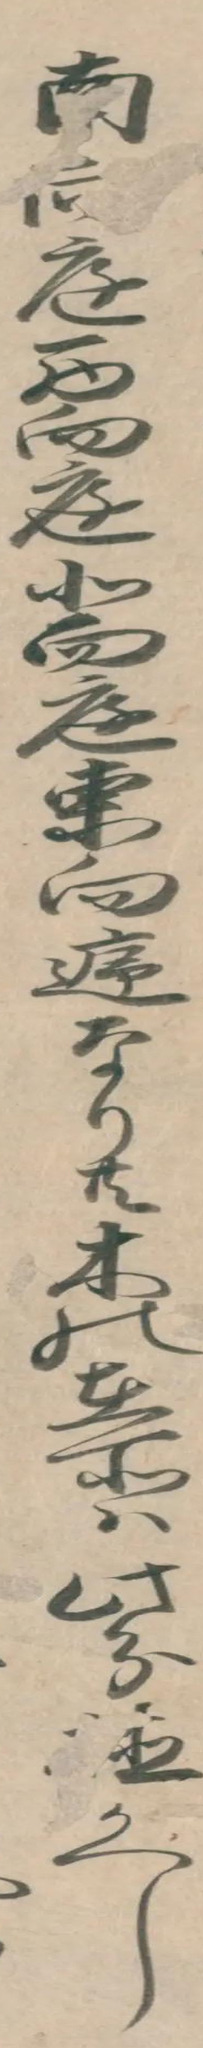一南向庭西向庭北西庭東向建なり共木の在所は此分かへし
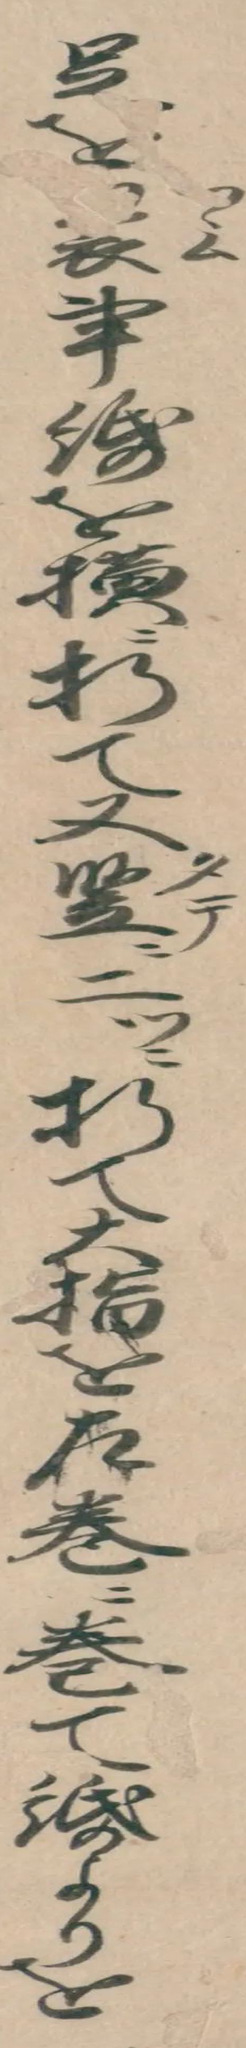是を半紙を横に持て又竪に二つに持て大指を左巻に巻て
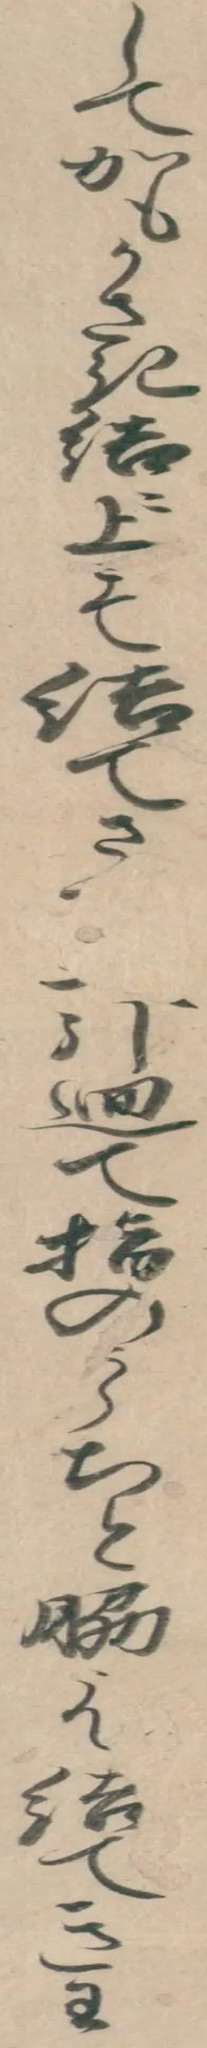してかもかさき結に上て結てさて引廻て指のうちと脇も結てきわ
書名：遊庭備忘略記
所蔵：国立国会図書館 National Diet Library, JAPAN
